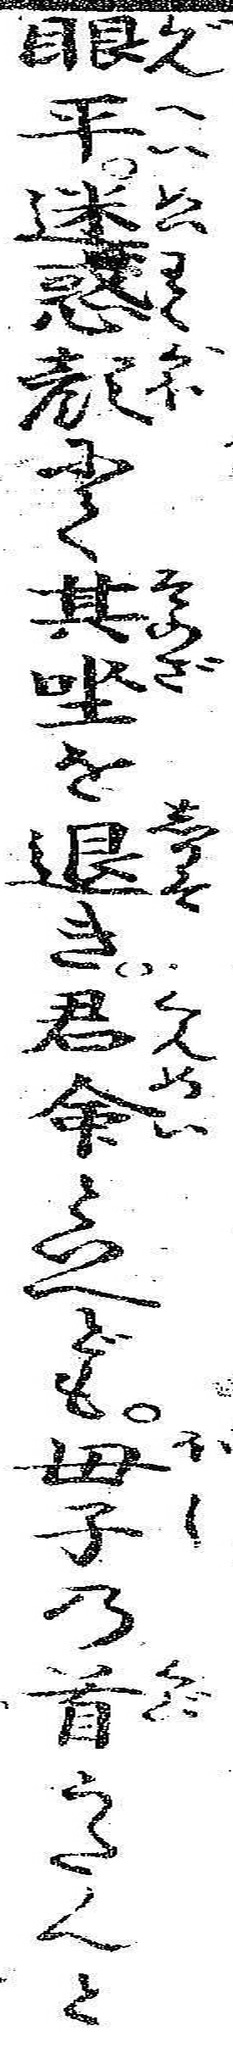眼平。迷惑顔にて其坐を退き。君命といへども。母子の首うたんと
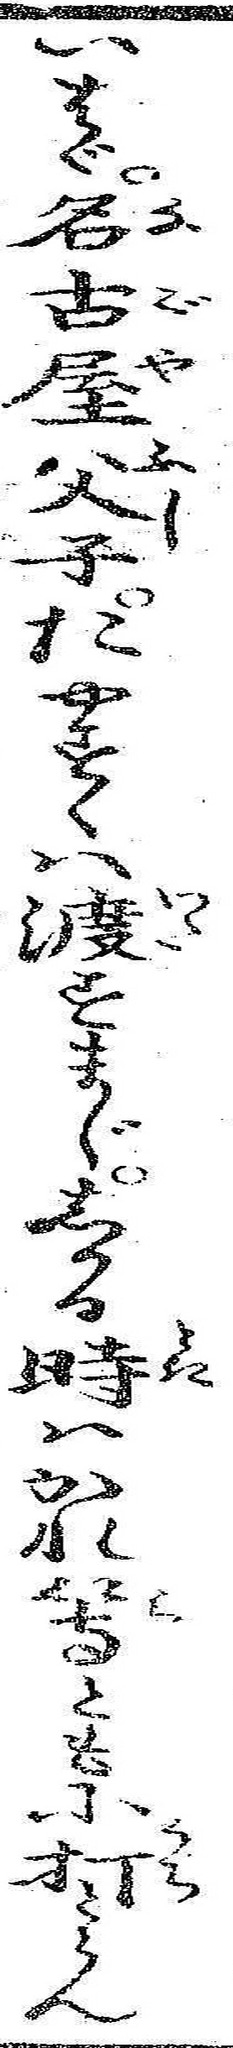いはゞ。名古屋父子。たやすくは渡すまじ。しかる時はかれ等ともに打とらん
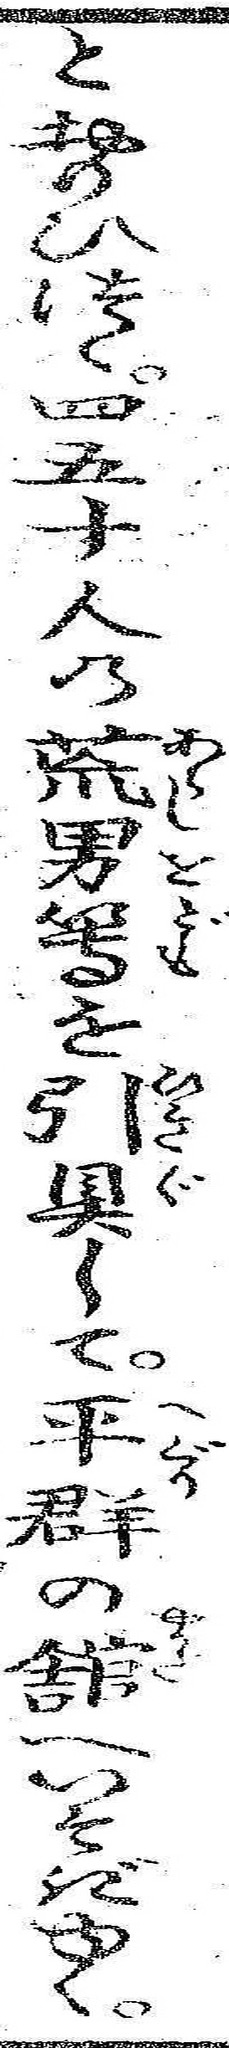とおもひつゝ。四五十人の荒男等を引具して。平群の館へいそぎゆく。
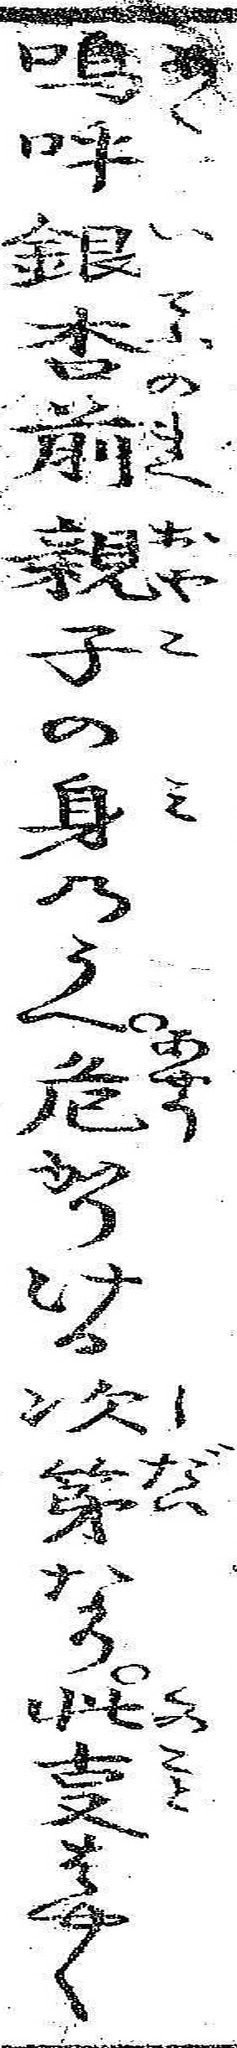鳴呼銀杏前親子の身のうへ。危かりける次第なり。此事はやく
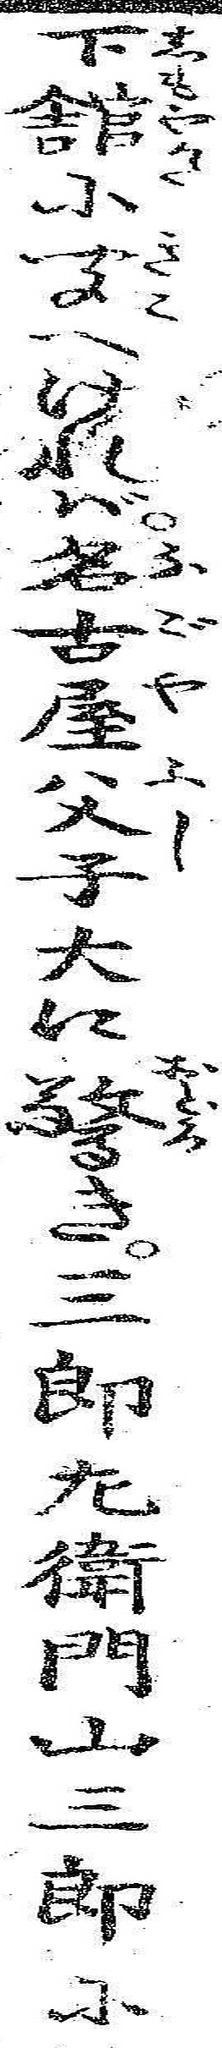下館に聞へければ。名古屋父子大に驚き。三郎左衛門山三郎に
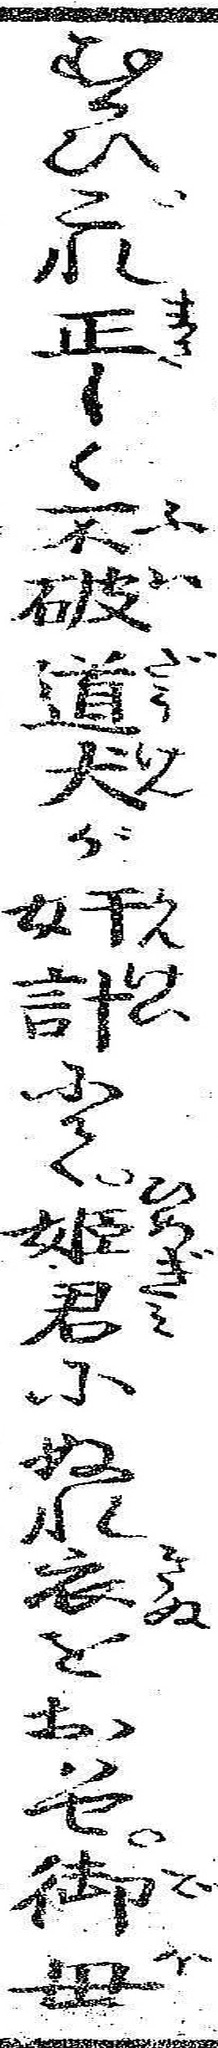むかひ。これ正しく不破道犬が奸計にて。姫君にぬれ衣をおはせ。御母
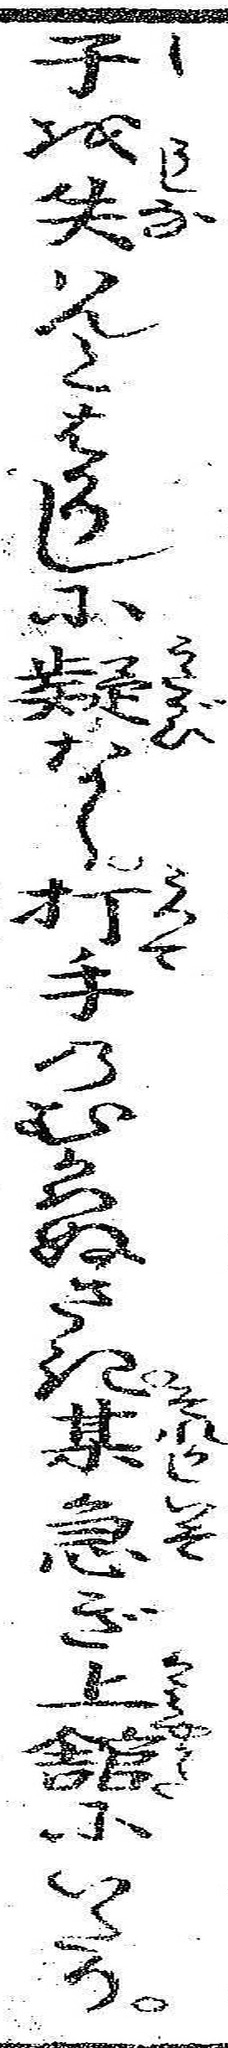子を失はんとはかりしに疑なし。打手のむかはぬさき。某急ぎ上館にいたり。
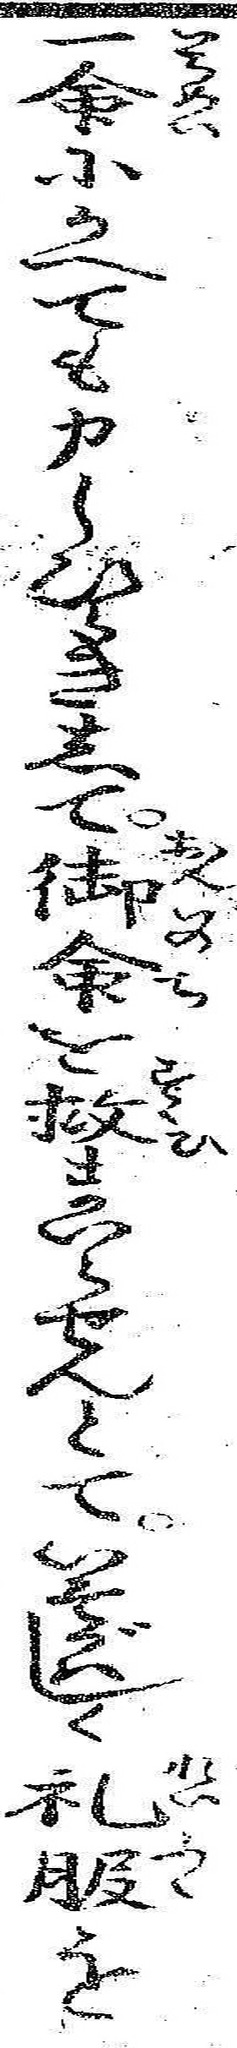一命にかへても申しひらきして。御命を救まいらせんとて。いそがしはく礼服を

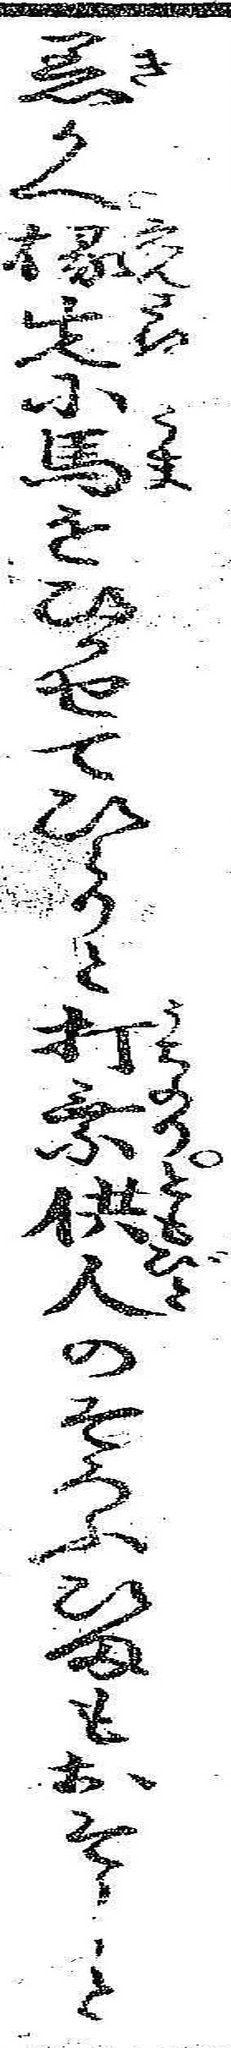着かへ。椽先に馬をひかせてひらりと打乗。供人のそろふひまもおそしと
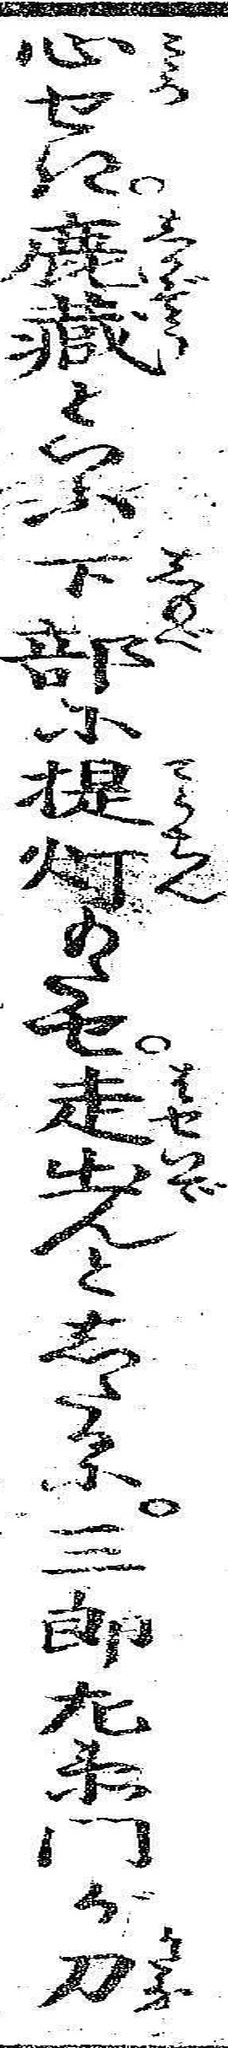心せき。鹿蔵といふ下部に提灯もたせ。走出んとしたるに。三郎左衛門が刀
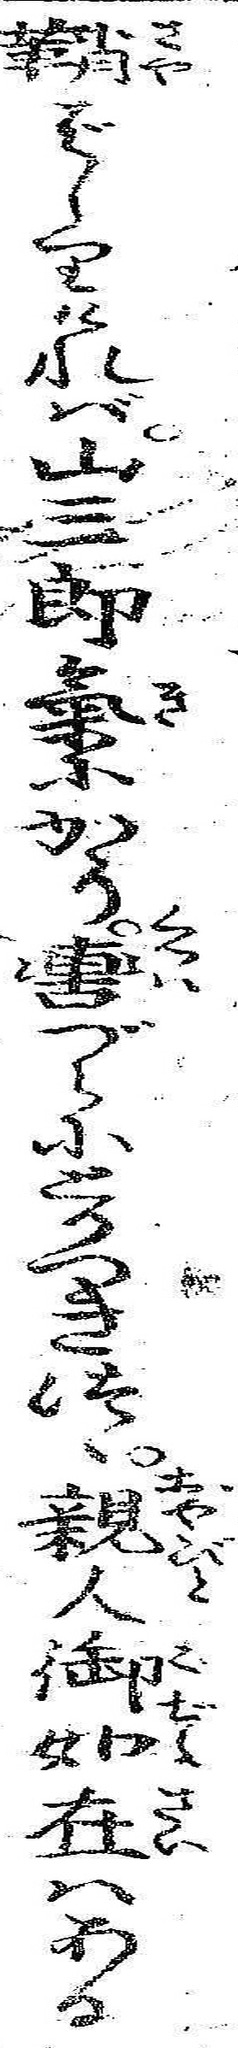鞘ばしりければ。山三郎気にかゝり。轡づらにとりつきつゝ。親人御如在はある
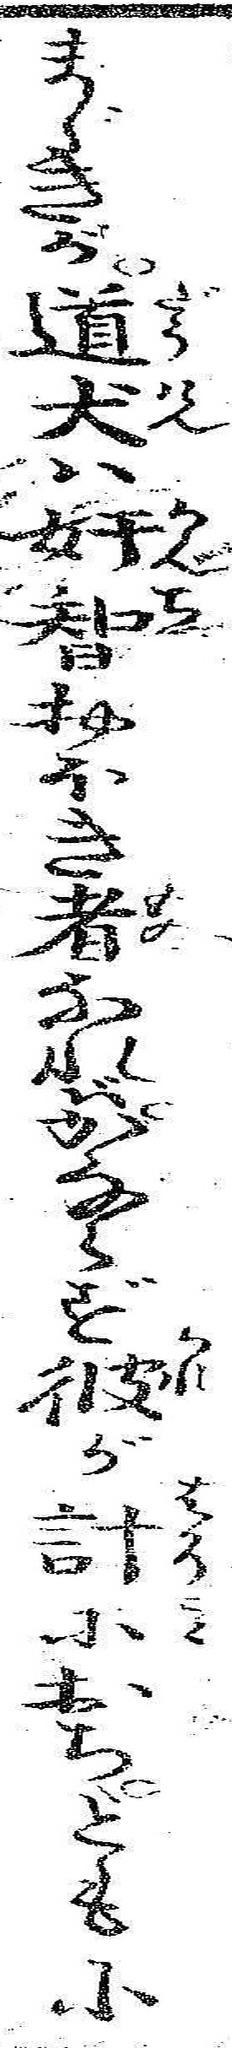まじきが。道犬は奸智おほき者なれば。かならず彼が計におち。ともに
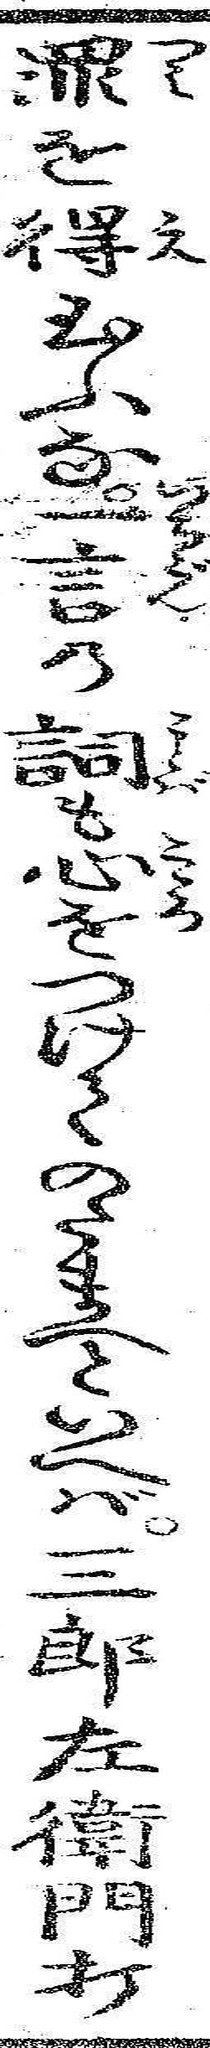罪を得玉ふな。一言の詞も心をつけてのたまへといへば。三郎左衛門打
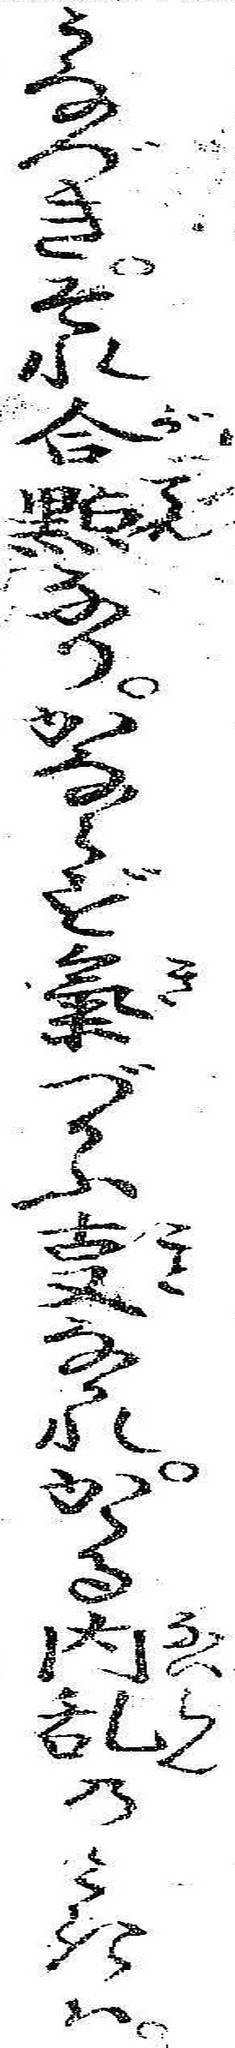うなづき。それ合点なり。かならず気づかふ事なかれ。かゝる内乱のときは。
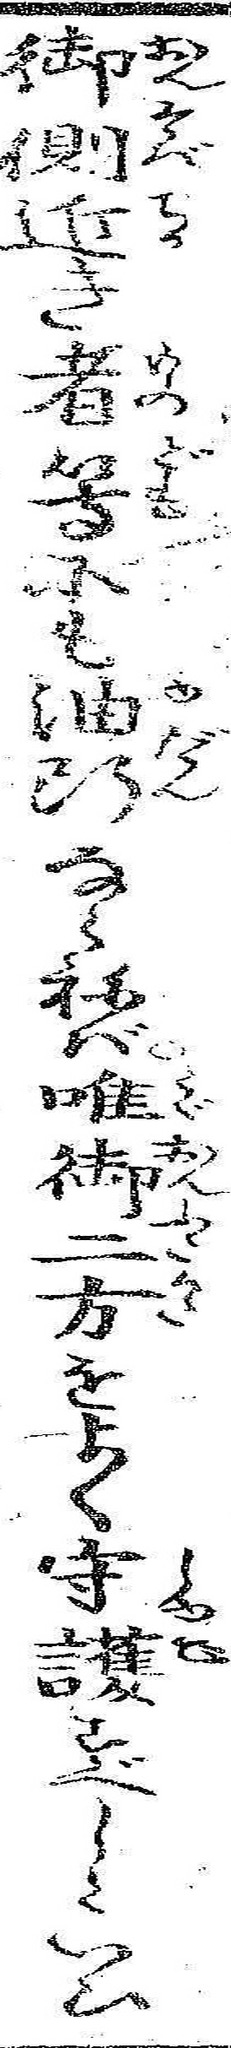御側近き者等にも油断ならねば。唯御二方をよく守護すべしといひ
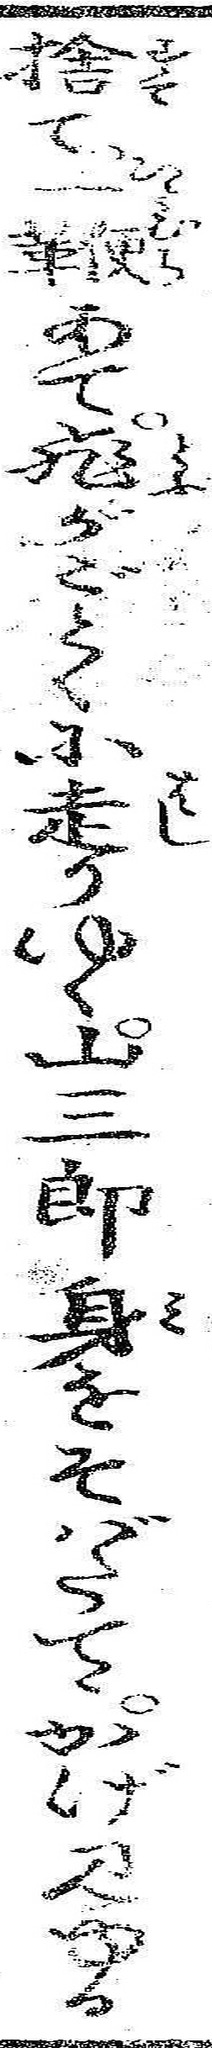捨て。一鞭あて。飛がごとくに走りゆく。山三郎身をそばたてゝ。かげ見ゆる
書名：昔話稲妻表紙
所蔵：国文学研究資料館
